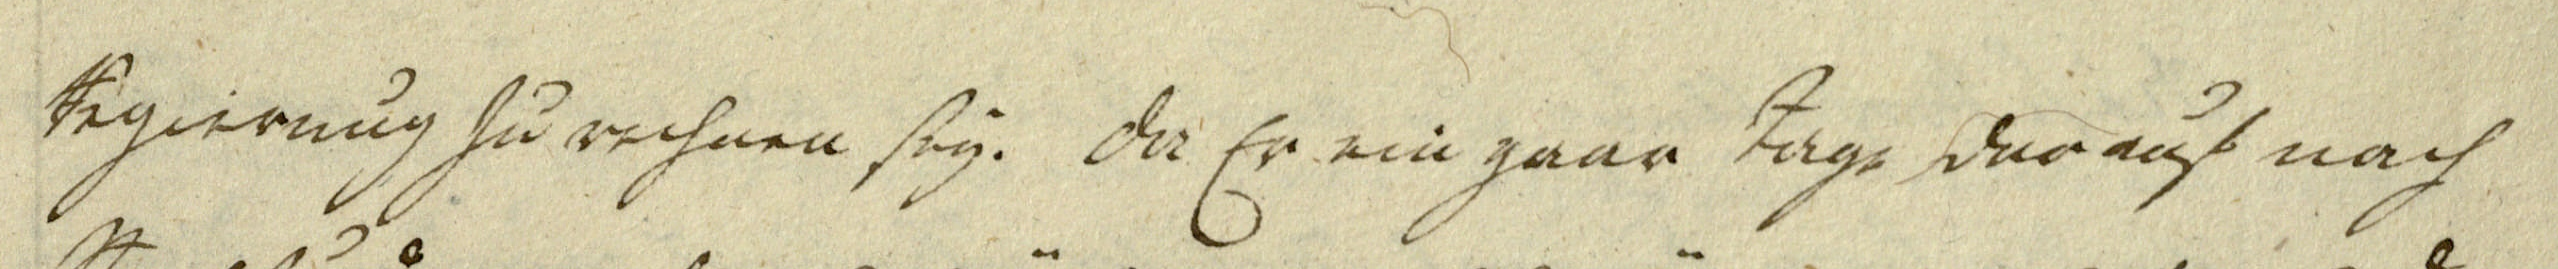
Regierung zu rechnen seÿ. Da Er ein paar Tage darauf nach
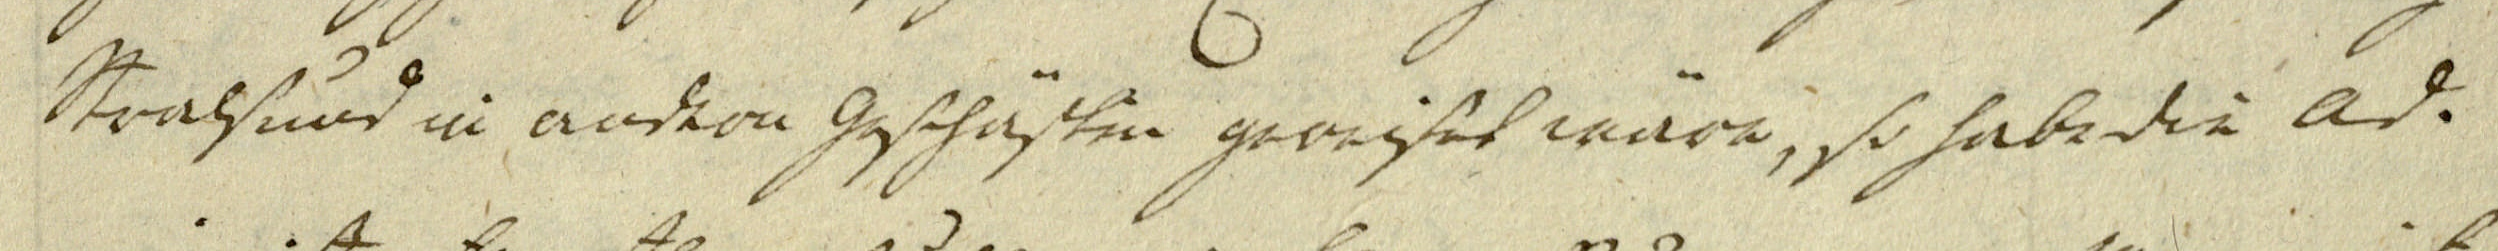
Stralsund in andern Geschäften gereiset wäre, so habe die Ad¬
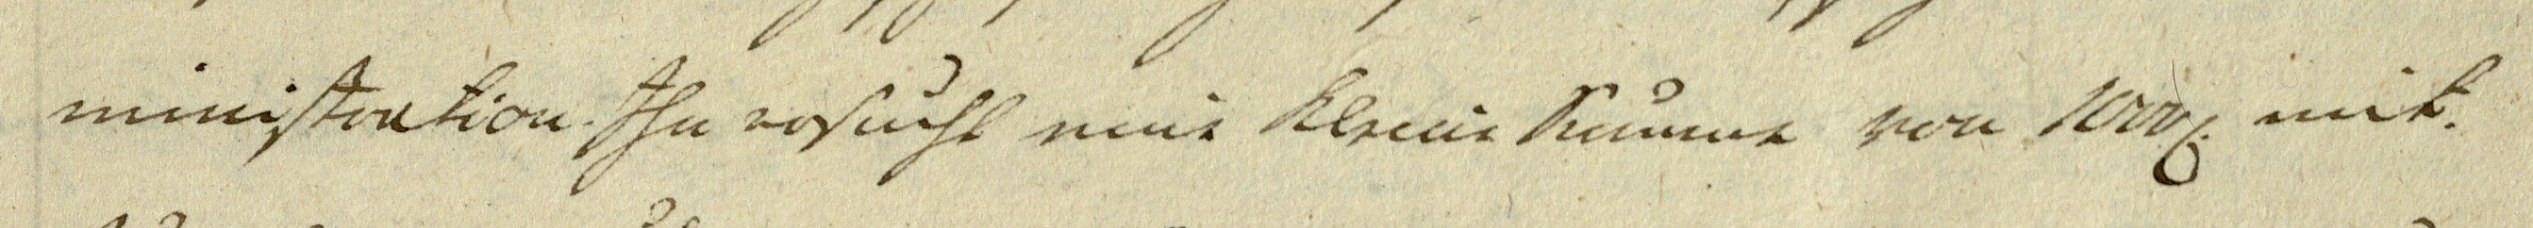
ministration Ihn ersucht eine kleine Summe von 1000 l. mit¬
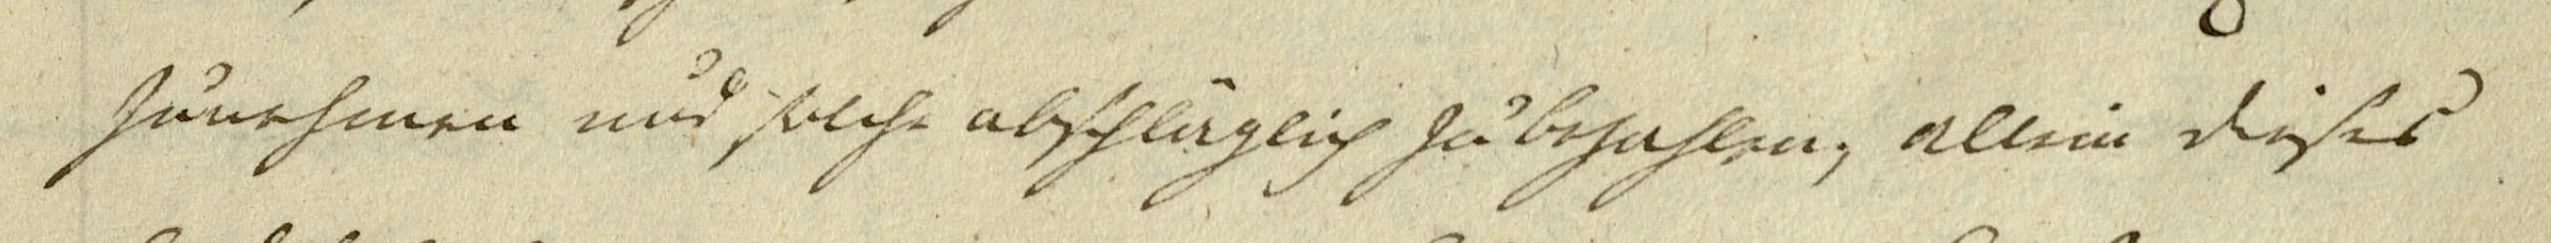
zunehmen und solche abschläglich zu bezahlen; allein dieses
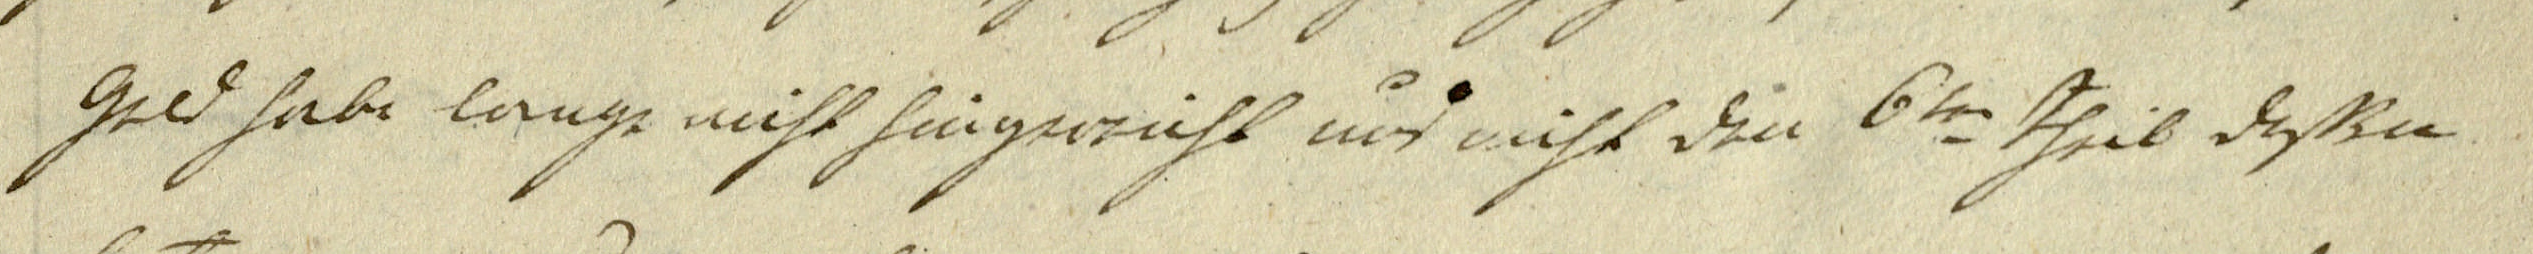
Geld habe lange nicht hingereicht und nicht den 6 ten. Theil dessen
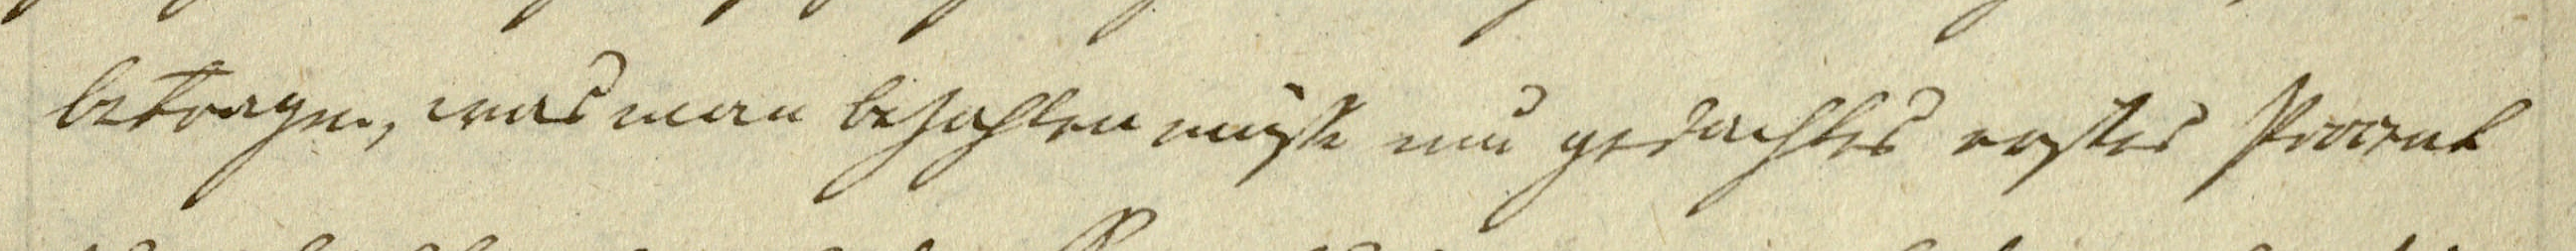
betragen, was man bezahlen müsse um gedachtes erstes Procent
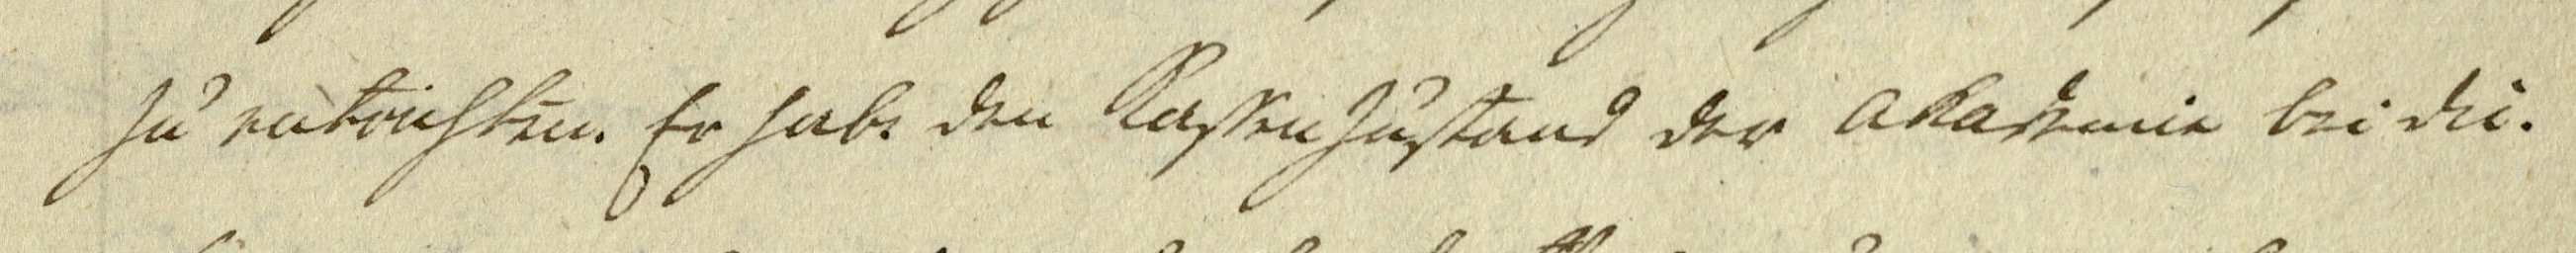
zu entrichten. Er habe den Kassenzustand der Akademie bei die¬
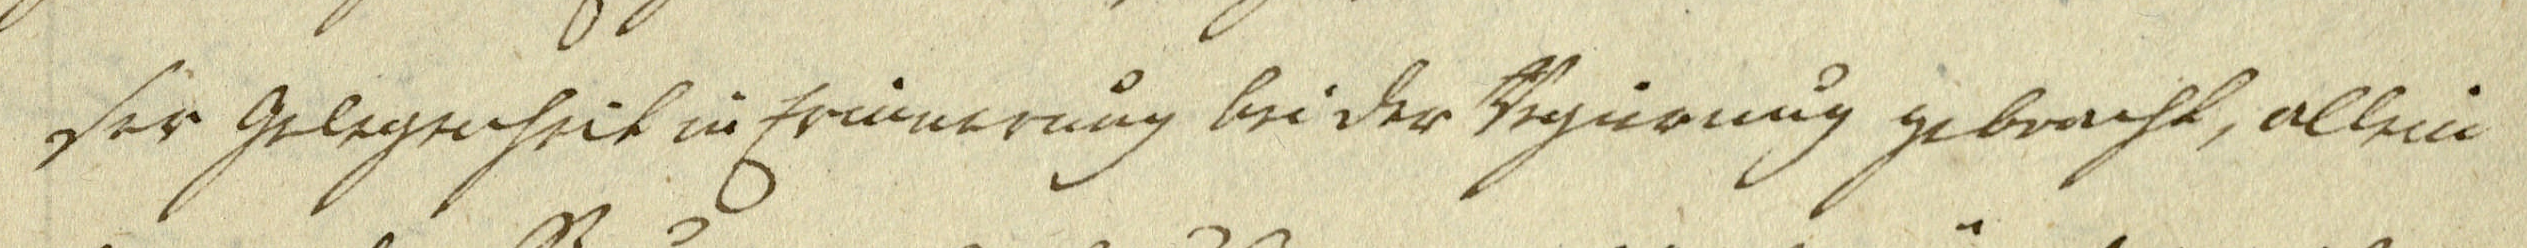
ser Gelegenheit in Erinnerung bei der Regierung gebracht, allein
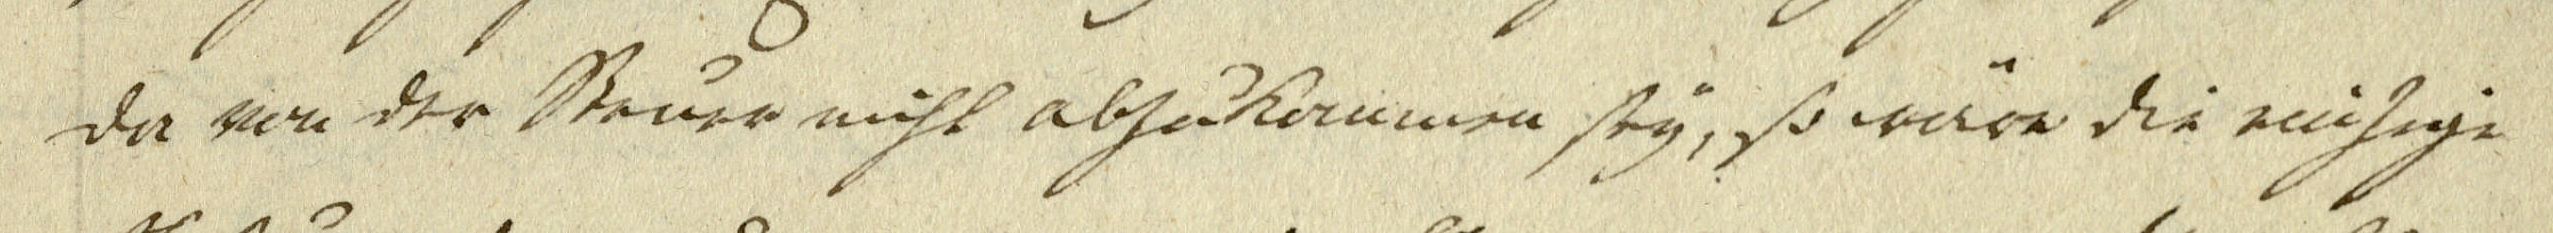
da von der Steuer nicht abzukommen seÿ, so wäre die einzige
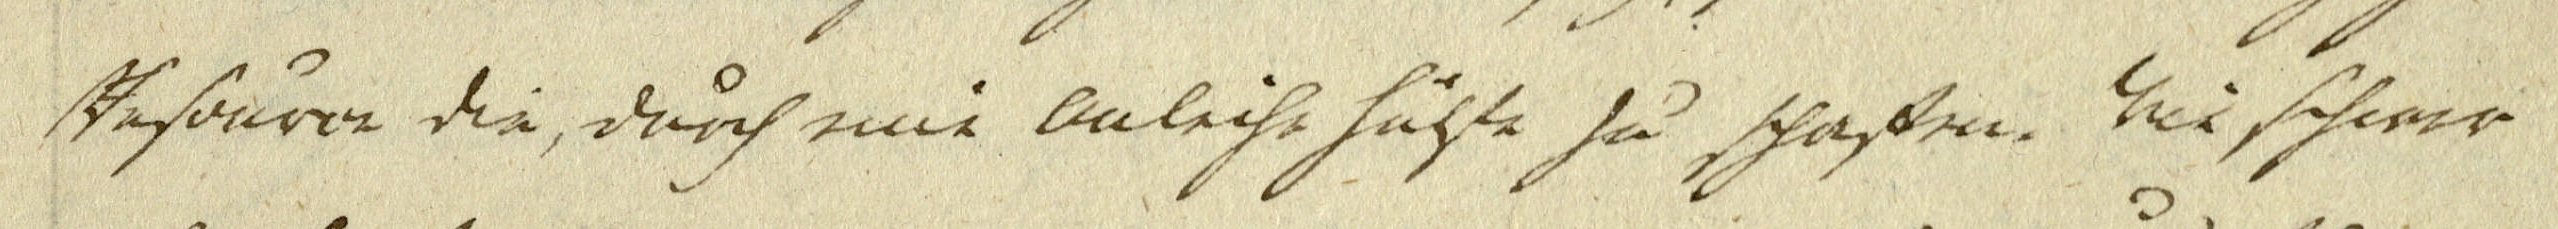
Resource die, durch eine Anleihe Hülfe zu schaffen. Wie schwer
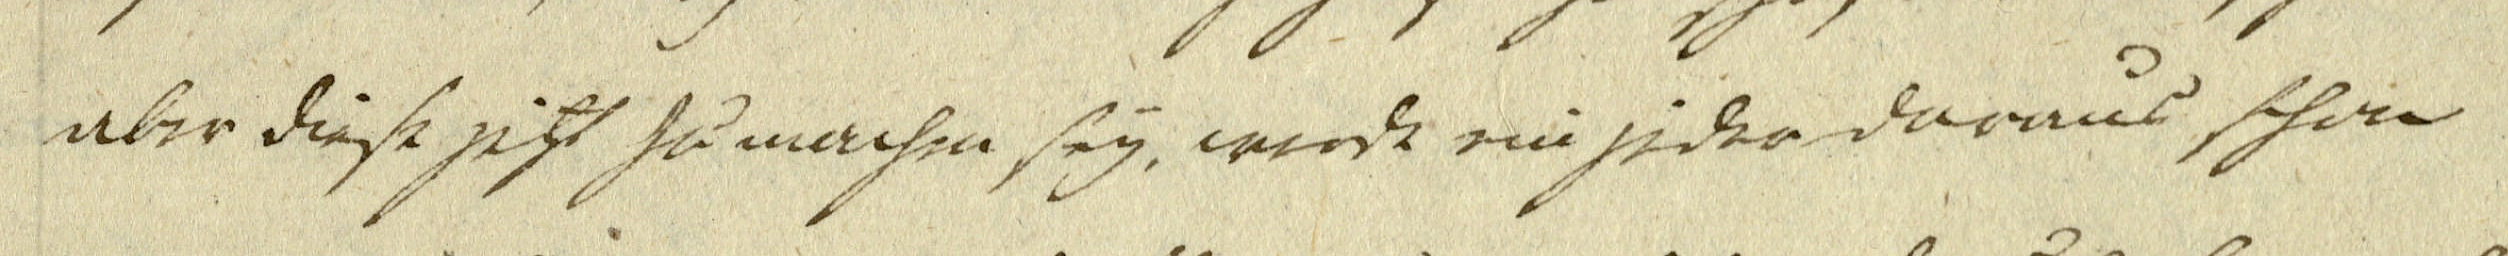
aber diese jetzt zu machen seÿ, werde ein jeder daraus schon
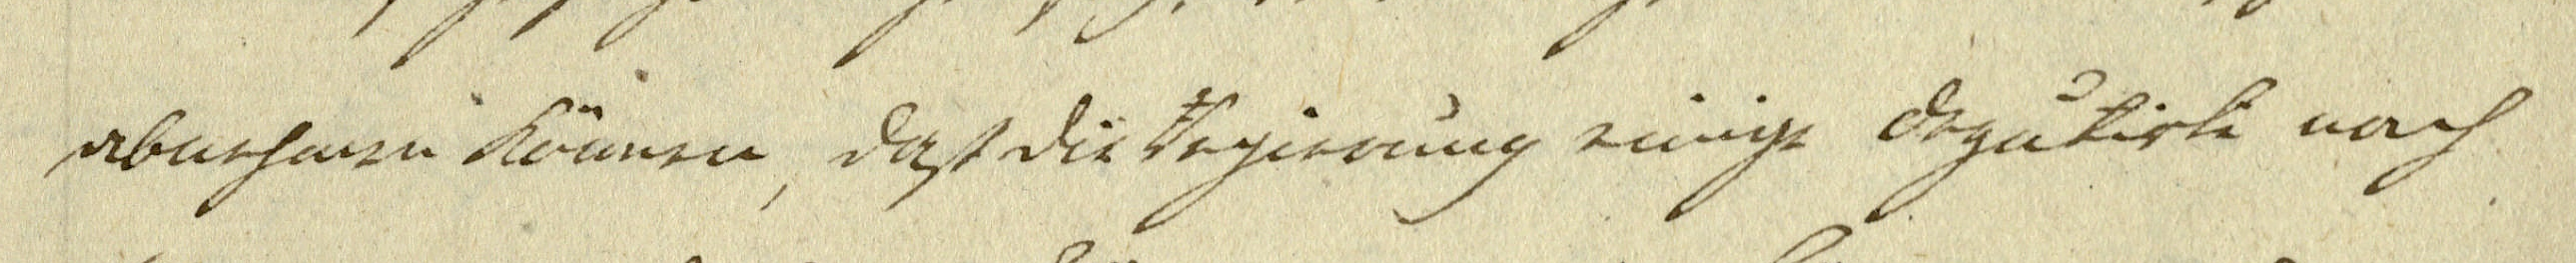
abnehmen können, daß die Regierung einige Deputirte nach
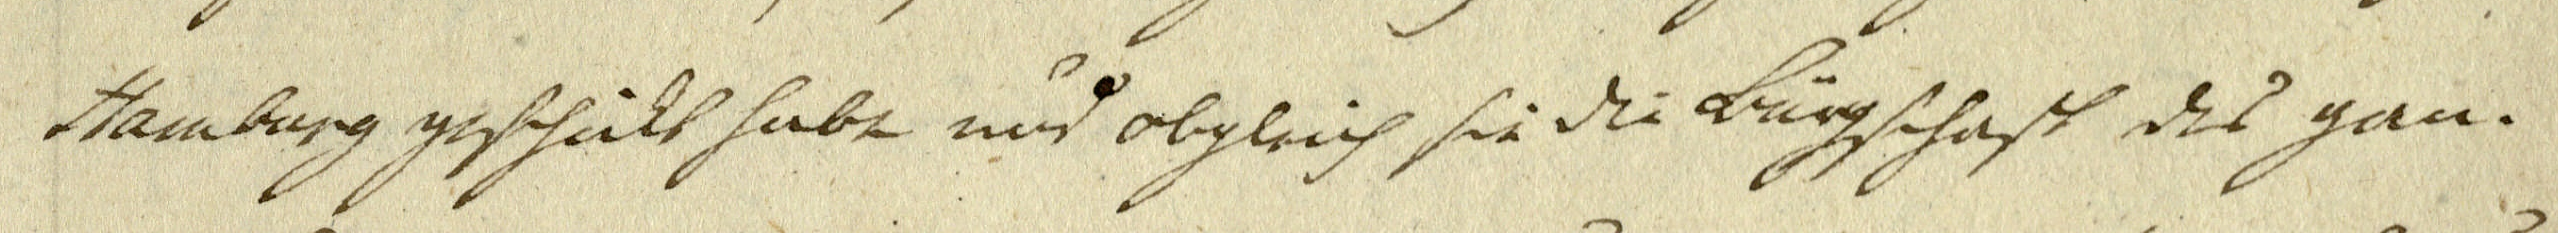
Hamburg geschickt habe und obgleich sie die Bürgschaft des gan¬
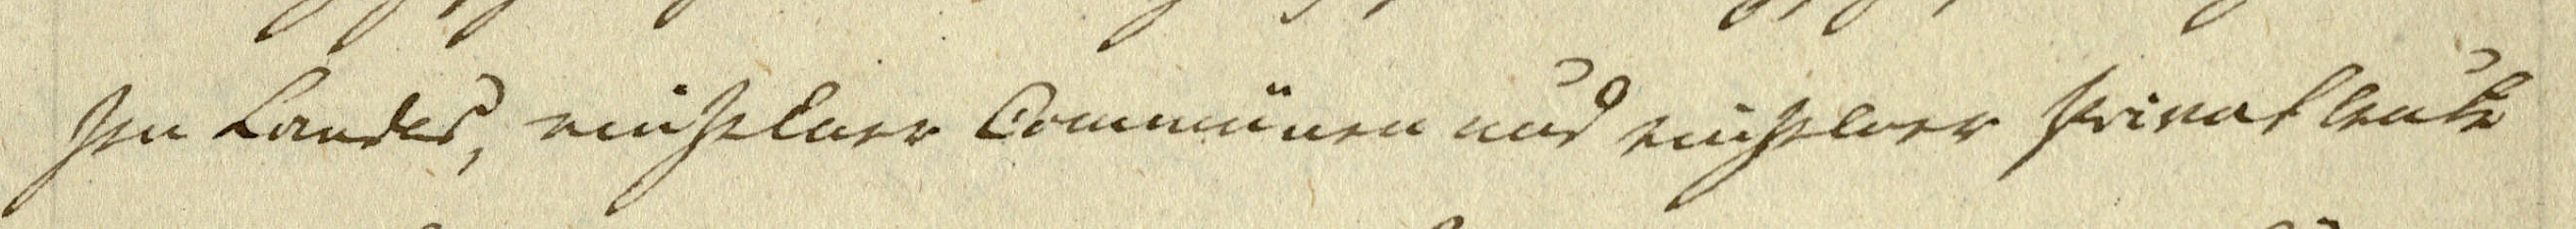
zen Landes, einzelner Commünen und einzelner Privatleute
